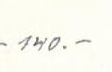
140.
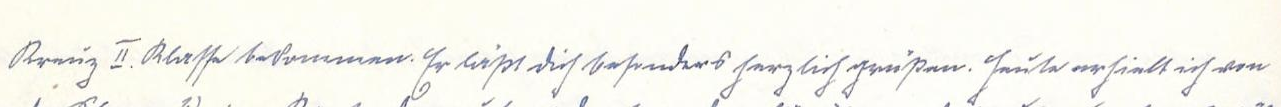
Kreuz II. Klasse bekommen. Er lässt dich besonders herzlich grüßen. Heute erhielt ich von
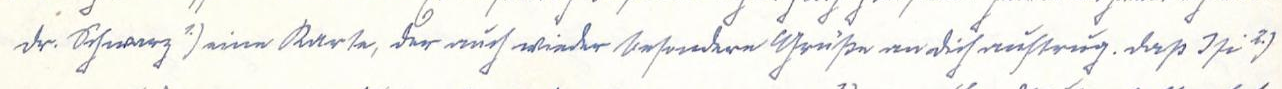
Dr. Schwarz 1) eine Karte, der auch wieder besondere Grüße an dich auftrug. Daß Isi 2)
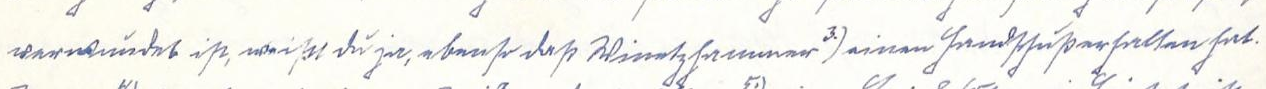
verwundet ist, weiß du ja, ebenso daß Winetzhammer 3) einen Handschußerhalten hat.
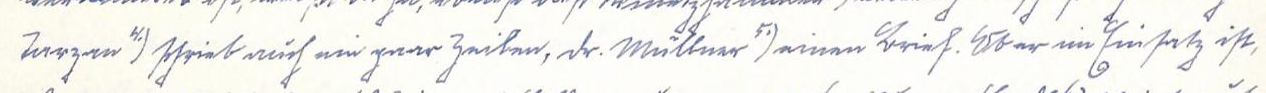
Tarzan 4) schrieb auch ein paar Zeilen, Dr. Müller 5) einen Brief. Ober im Einsatz ist,
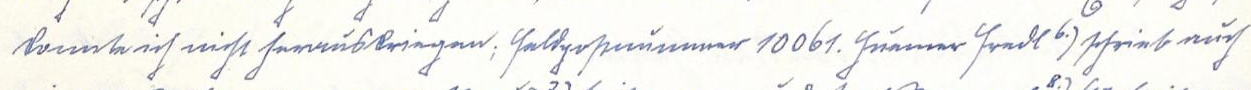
konnte ich nicht herauskriegen, Feldpostumnmer 10061. Huemer Ferdl 6) schrieb auch
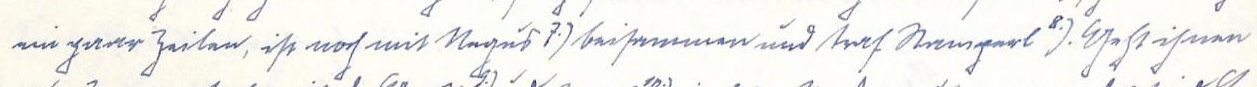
ein paar Zeilen, ist noch mit Negus 7) beisammen und traf Stanperl 8). Geht ihnen
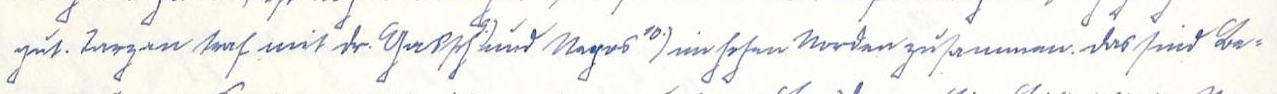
gut. Tarzen traf mit Dr. Gassl und Negus 9) im schönen Norden zusammen. Das sind Be-
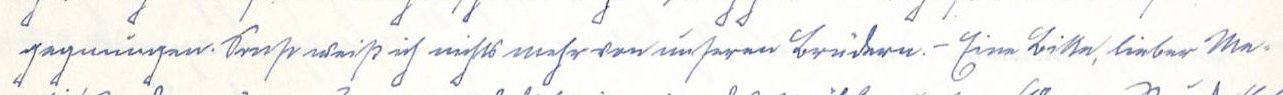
gegnungen. Sonst weiß ich nichts mehr von unseren Brüdern. Eine Bitte, lieber Me-
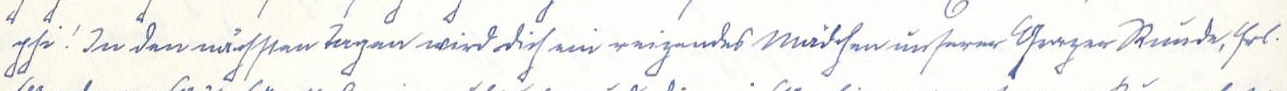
phi! In den nächster Tagen wird dich ein reizendes Mädchen unserer Grazer Runde, Frl.
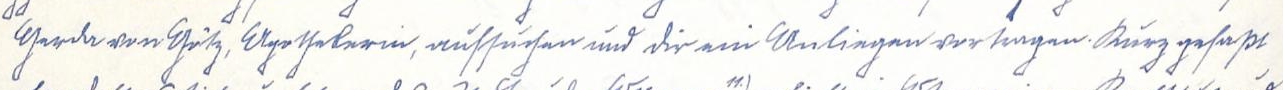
Gerda von Götz, Apothekerin, aufsuchen und dir ein Anlingen vortragen. Kurz gefaßt
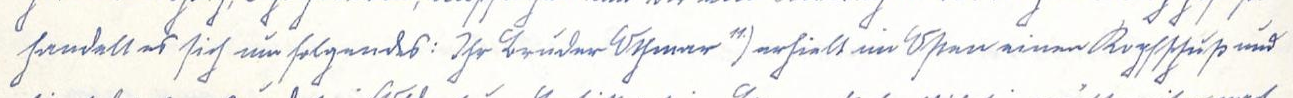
handelt es sich um folgendes: Ihr Bruder Othmar 11) erhielt im OSten einen Kopfschuß und
